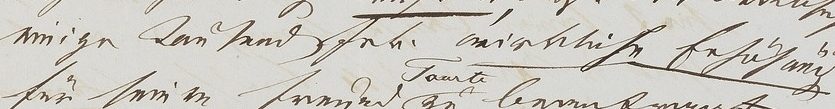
einige Tausend frk. wirkliche Erhöhung
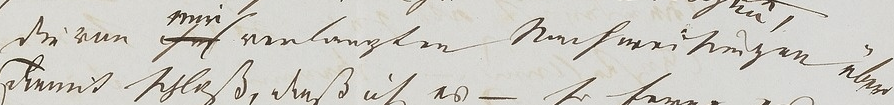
die von ihmmir verlangten Nachweisungen über
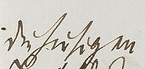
die hiesigen
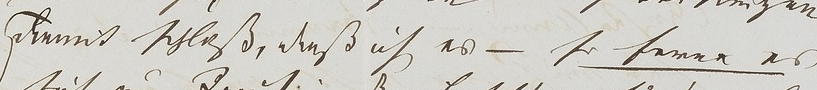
damit schloß, daß ich es – so ferne es
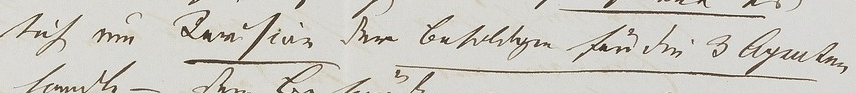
sich um Revision der Besoldgen für die 3 Agenten
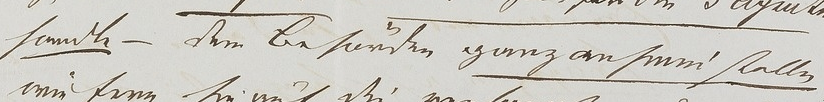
handle – den Behörden ganz anheim stelle,
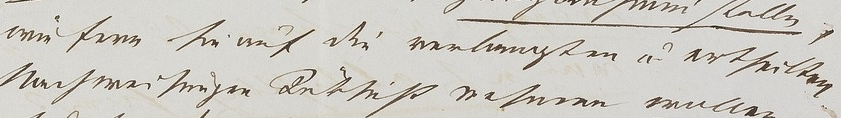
wie fern sie auf die verlangten u. ertheilten
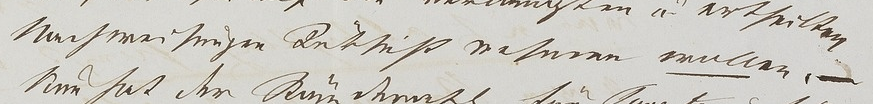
Nachweisungen Rüksicht nehmen wollen. –
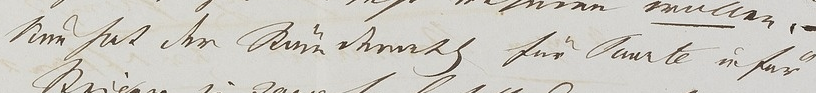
Nun hat der Ständerath für Tourte u. für
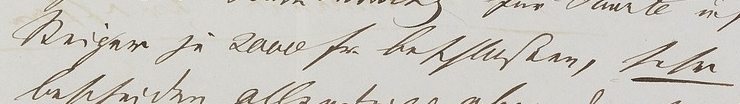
Steiger je 2000 fr. beschlossen, sehr
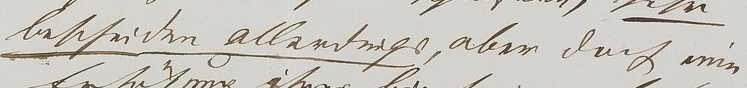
bescheiden allerdings, aber doch eine
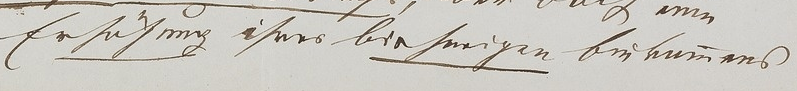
Erhöhung ihres bisherigen Einkommens.
